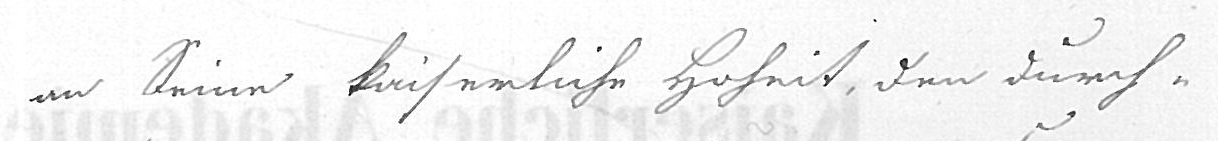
an Seine kaiserliche Hoheit, den durch-
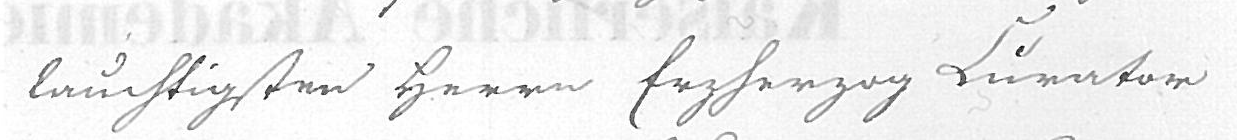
lauchtigsten Herrn Erzherzog Curator
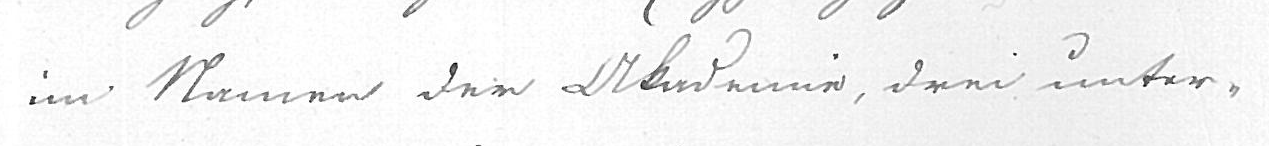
im Namen der Akademie, drei unter-
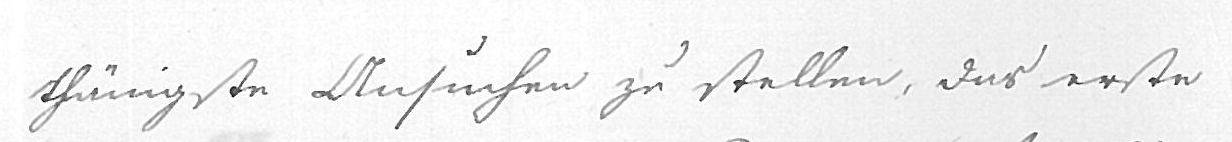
thänigste Ansuchen zu stellen, das erste
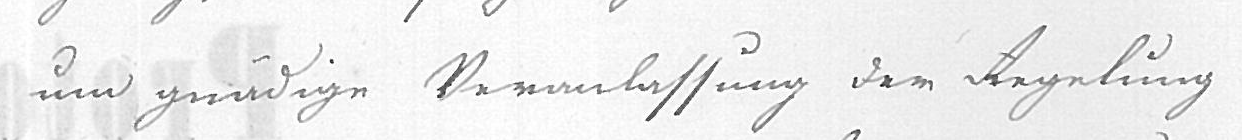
um gnädie Veranlassung der Regelung
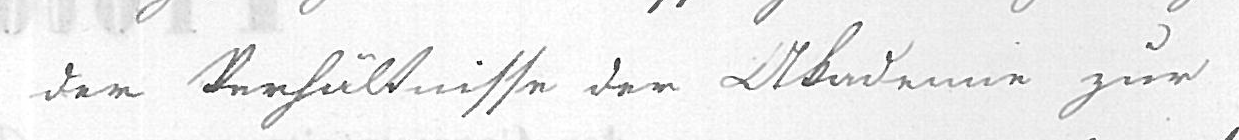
der Verhältnisse der Akademie zur
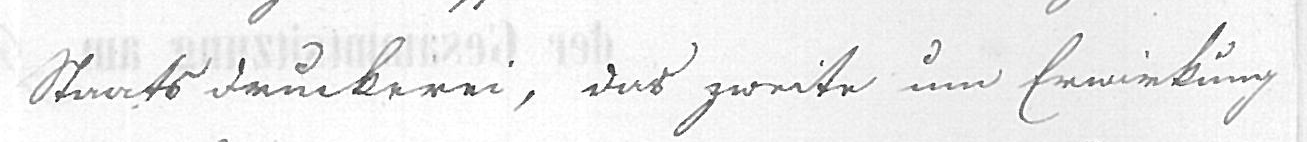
Staatsdruckerei, das zweite um Erwirkung
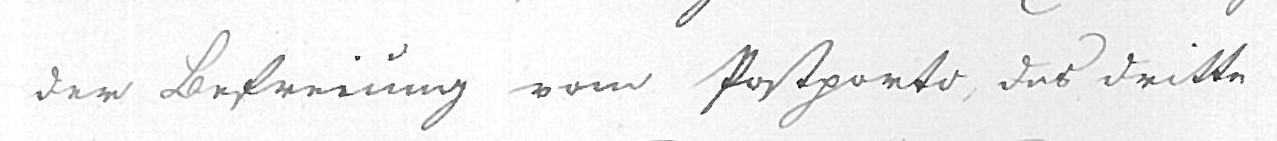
der Befreiung vom Postporto, das dritte
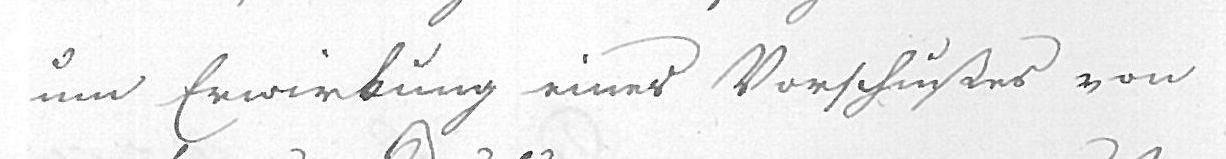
um Erwirkung eines Vorschlußes von
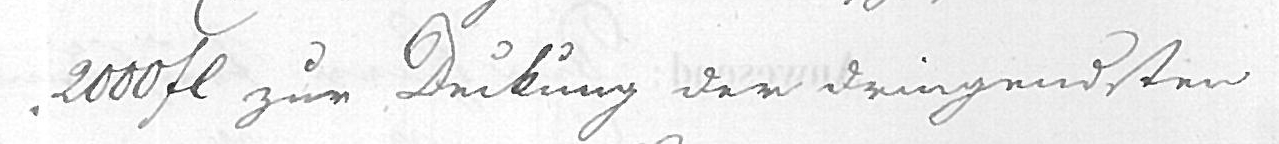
2000 fl. zur Deckung der dringendsten
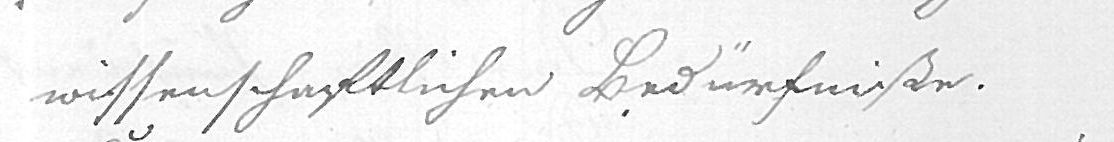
wissenschaftlichen Bedürfniße.
